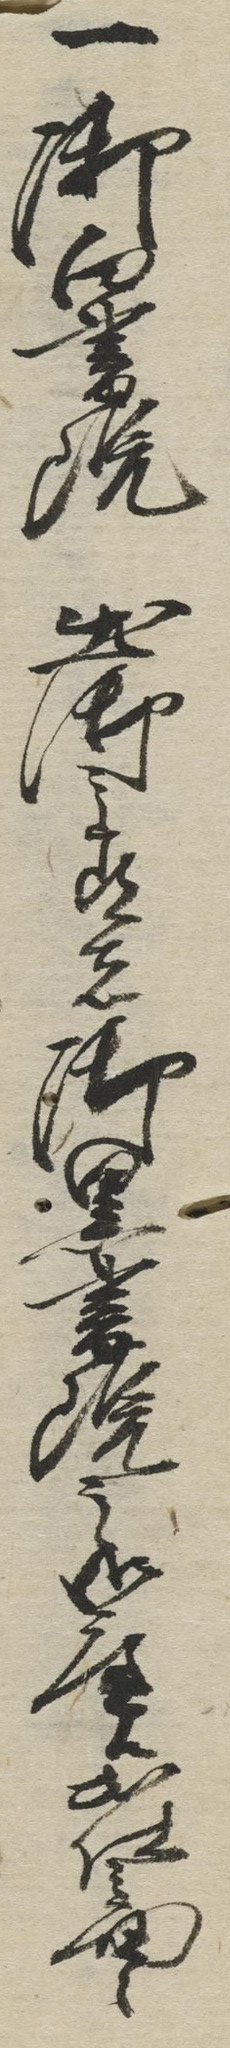一御白書院出御之節は御黒書院之御庭江出仕之面々
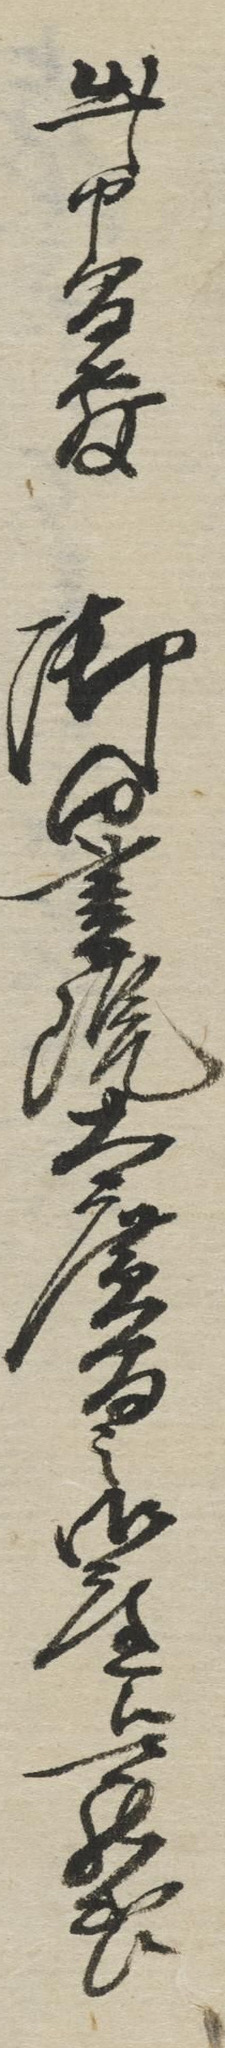出申間敷御白書院大広間之御庭江可罷出候
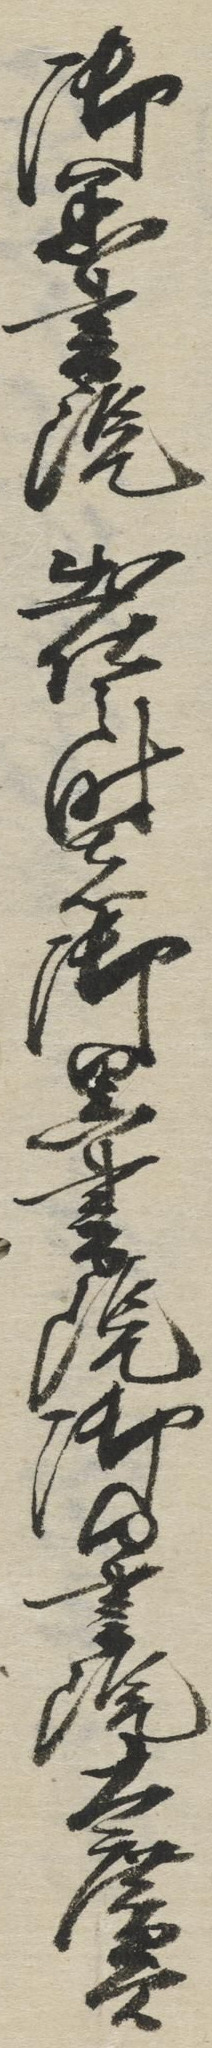御黒書院出仕之時は御黒書院御白書院大広間
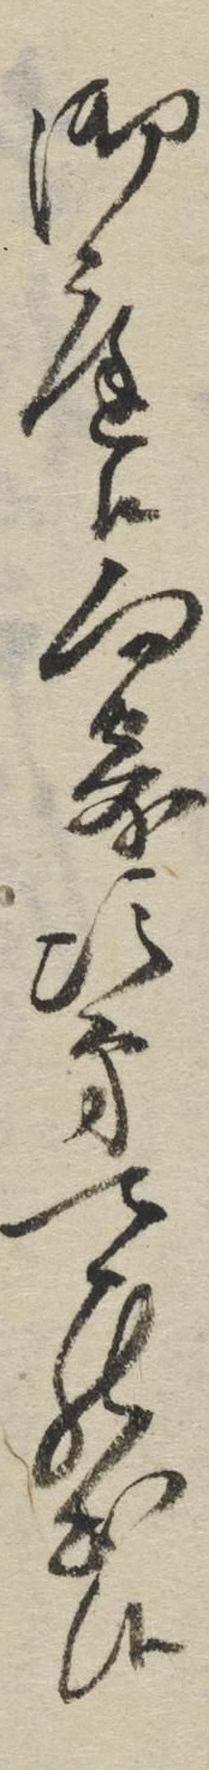御庭江向寄次第可罷出候
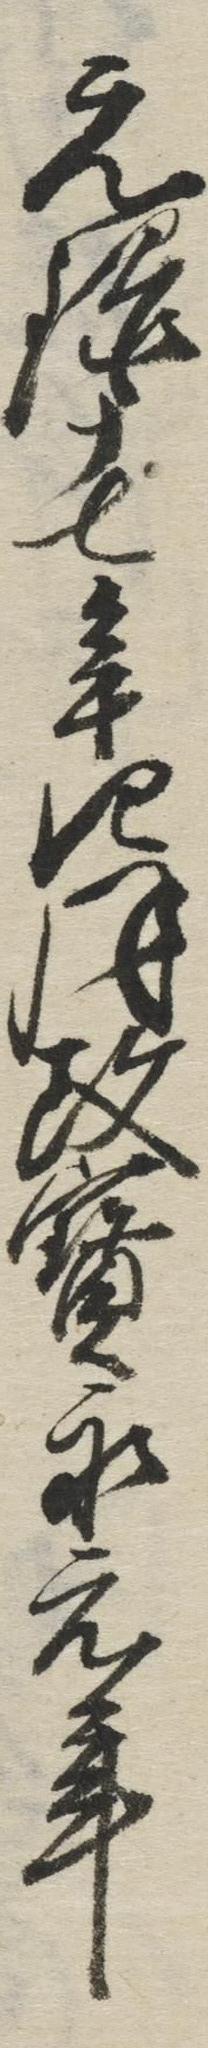元禄十七年四月改寶永元年
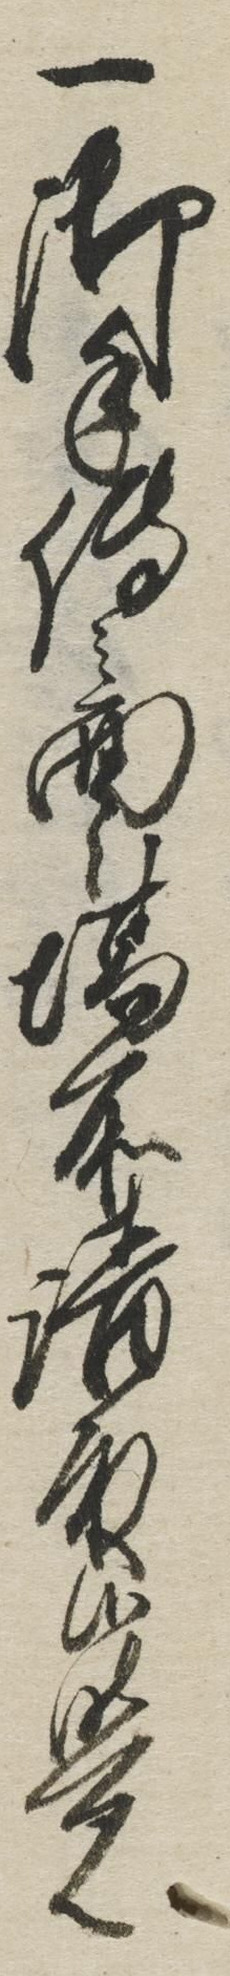一御手伝之面々場所請取候覚
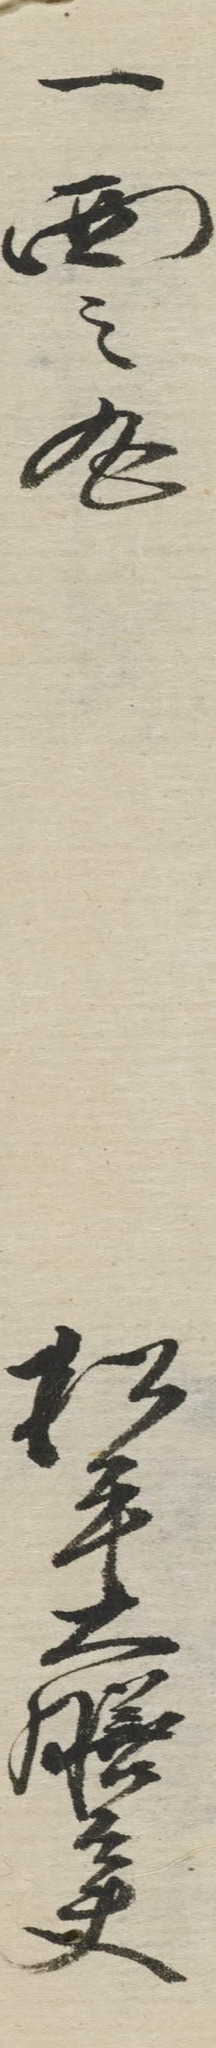一西之丸松平大膳太夫
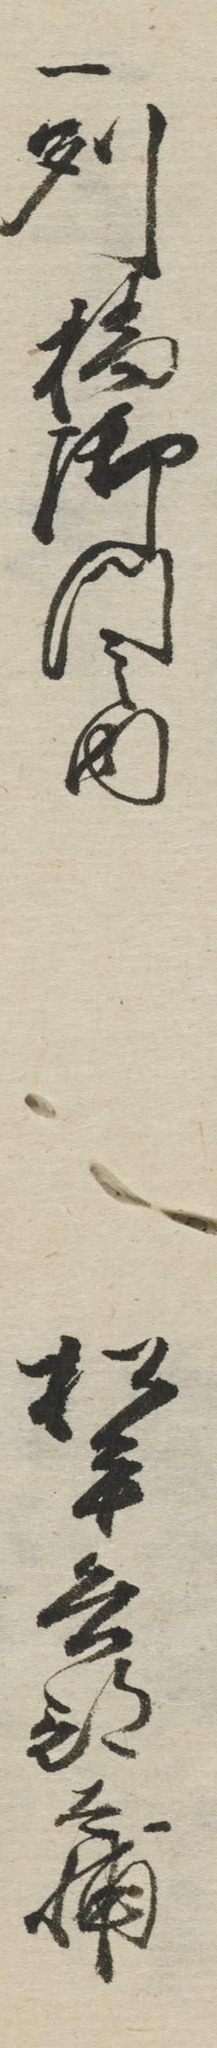一列橋御門之内松平兵部太輔
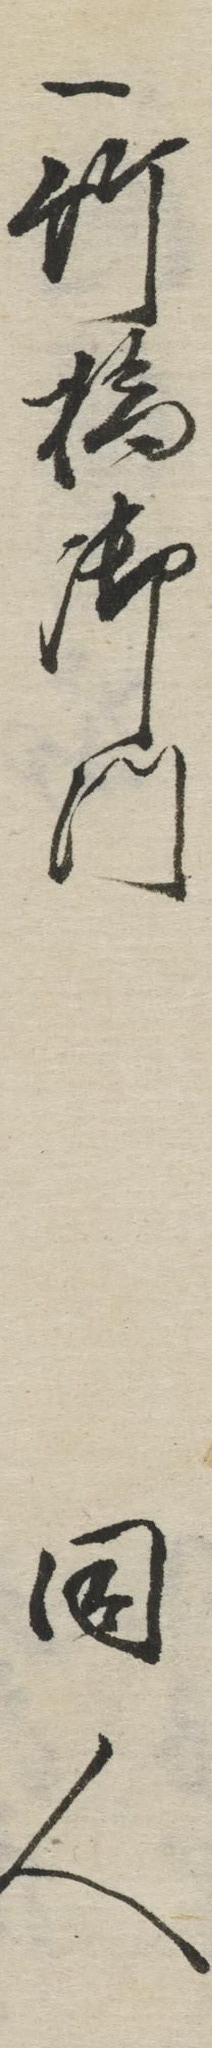一竹橋御門同人
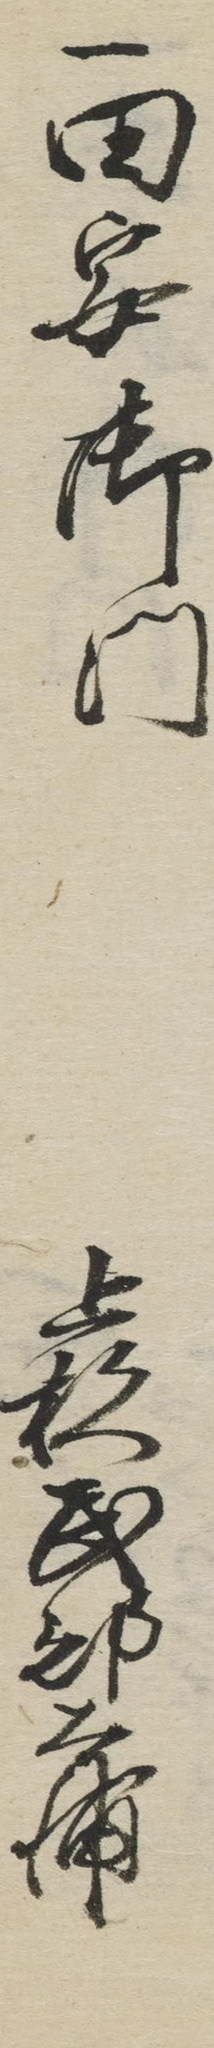一田安御門上杉民部太輔
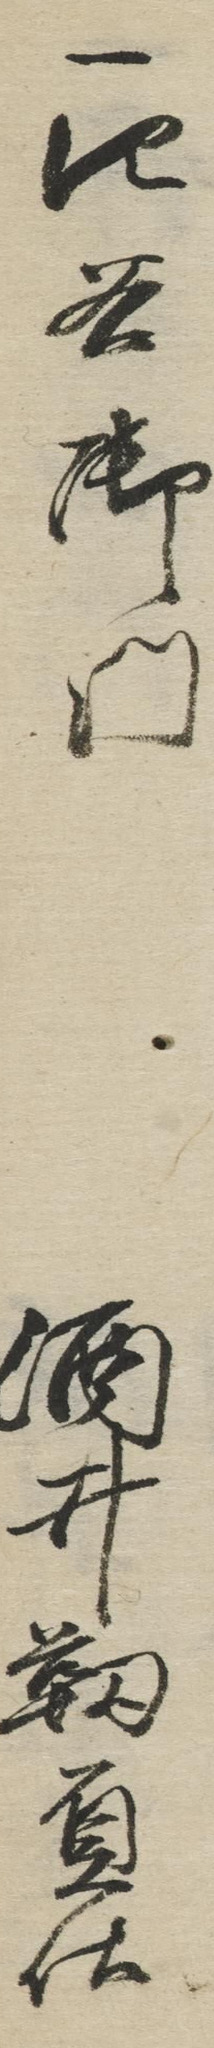一四谷御門酒井靭負佐

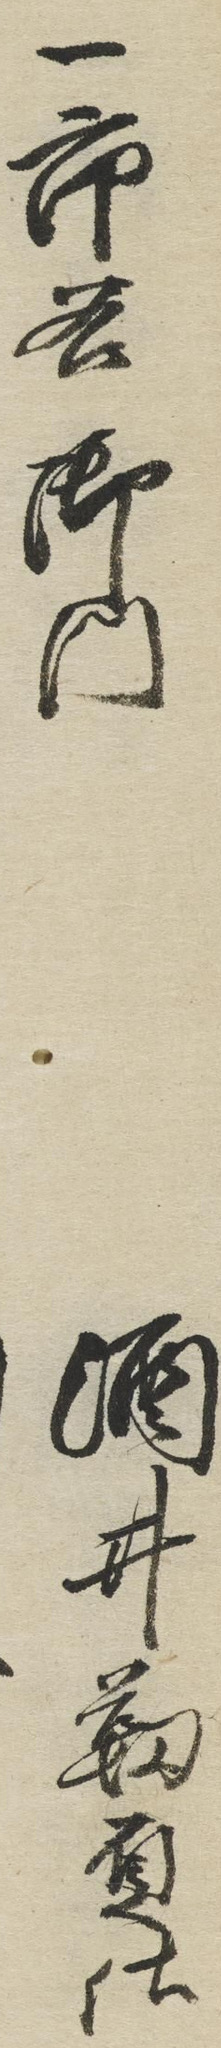一市谷御門酒井靭負佐
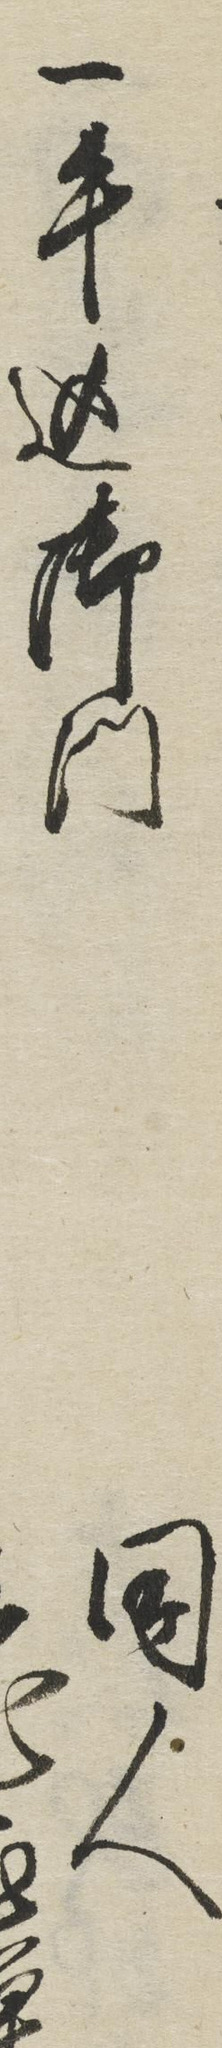一牛込御門同人
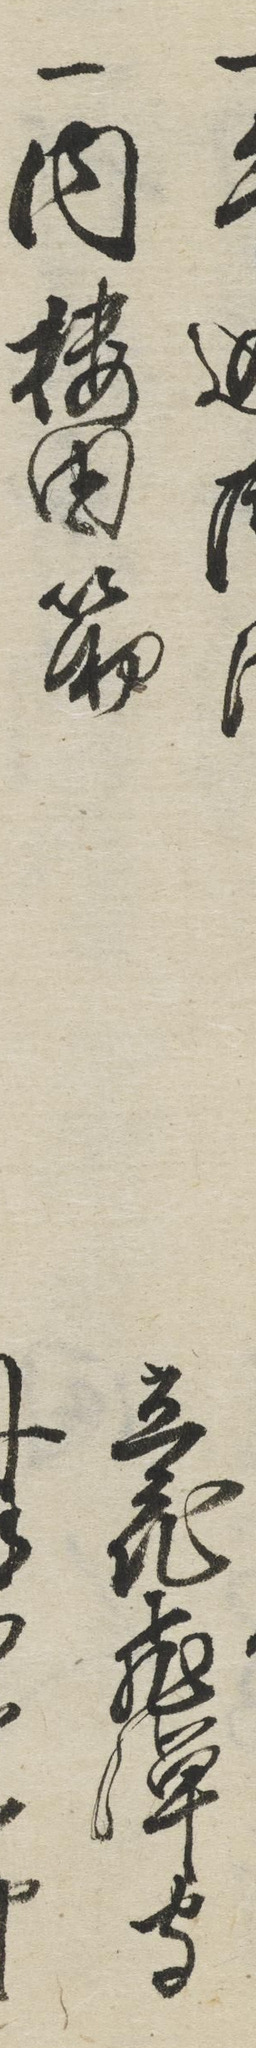一内桜田筋立花飛騨守
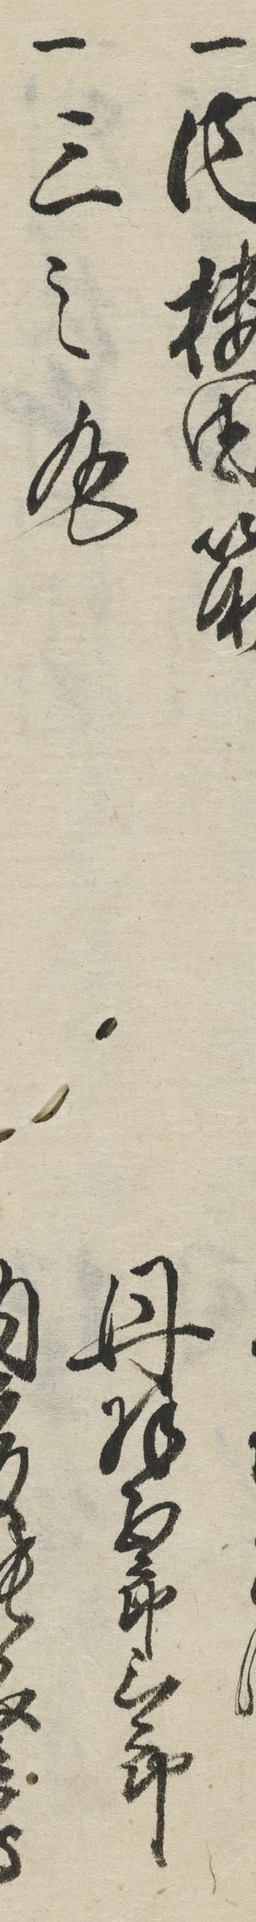一三之丸丹羽五郎三郎
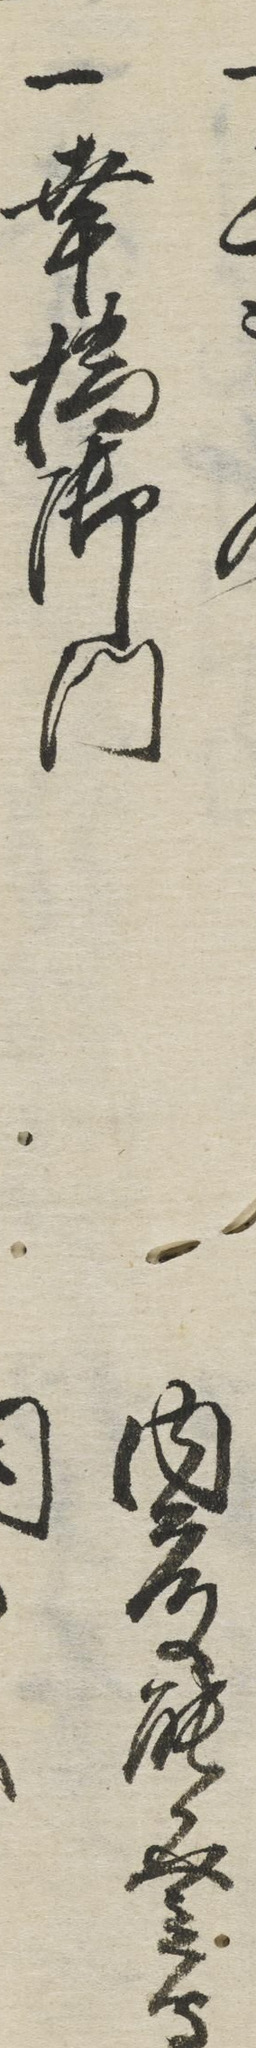一幸橋御門内藤能登守
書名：元禄地震記
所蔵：東京大学地震研究所図書室 Earthquake Research Institute Library, The University of Tokyo, JAPAN
